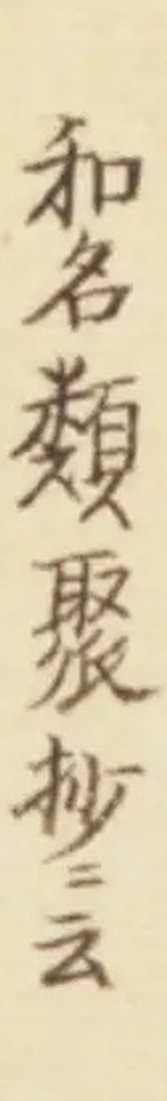和名類聚抄云
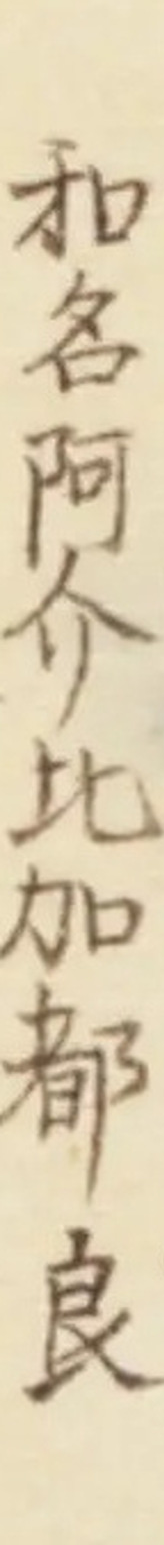和名阿介比加都良
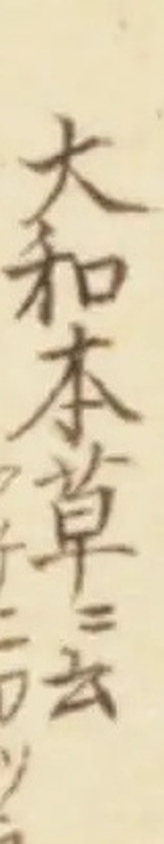大和本草云
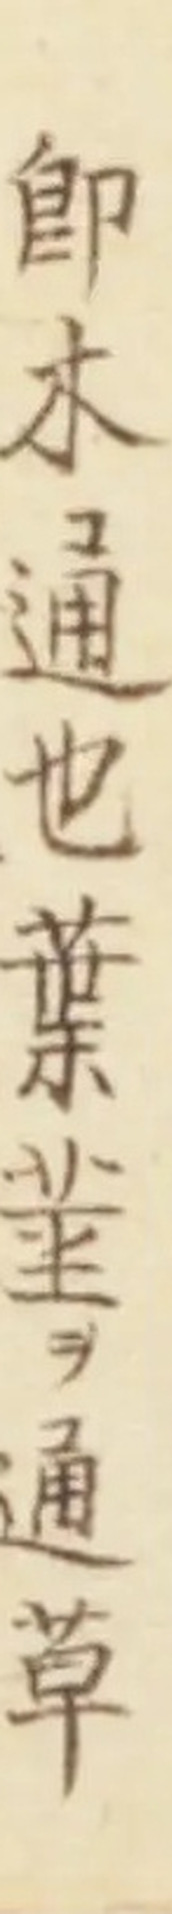即木通也葉茎通草
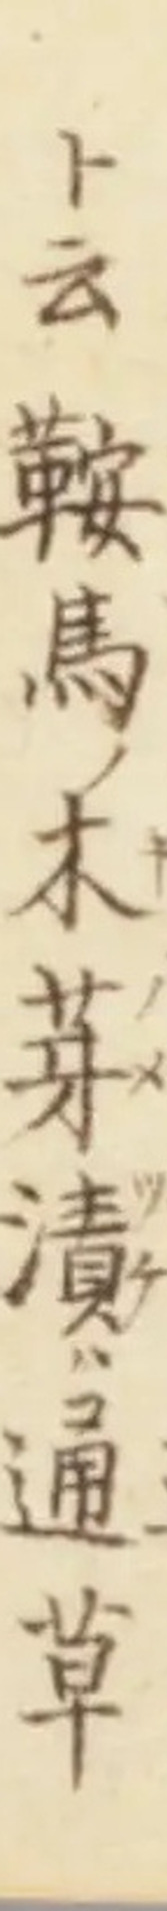ト云鞍馬木芽漬通草

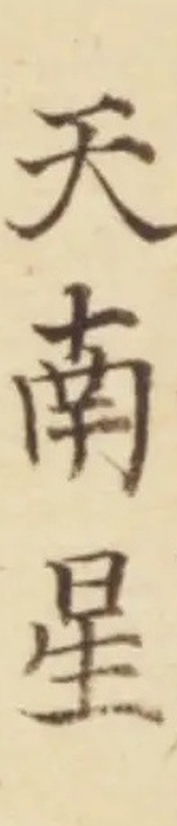天南星
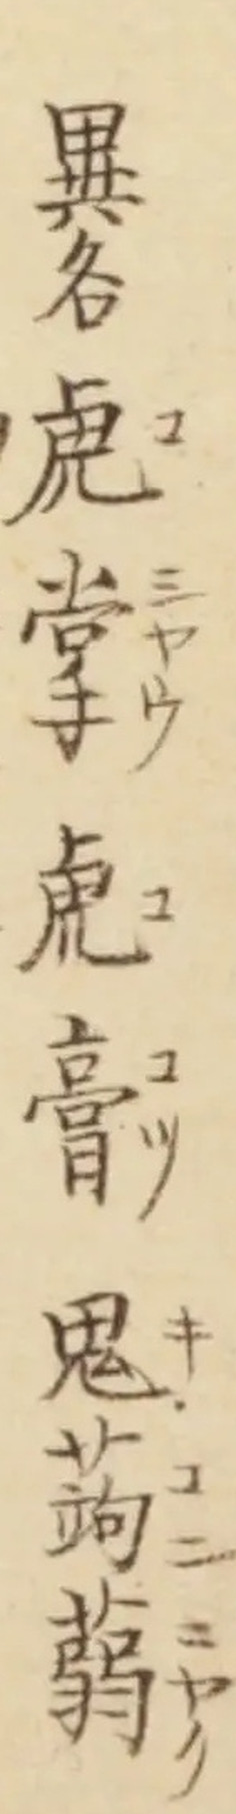異名虎掌虎膏鬼蒟蒻
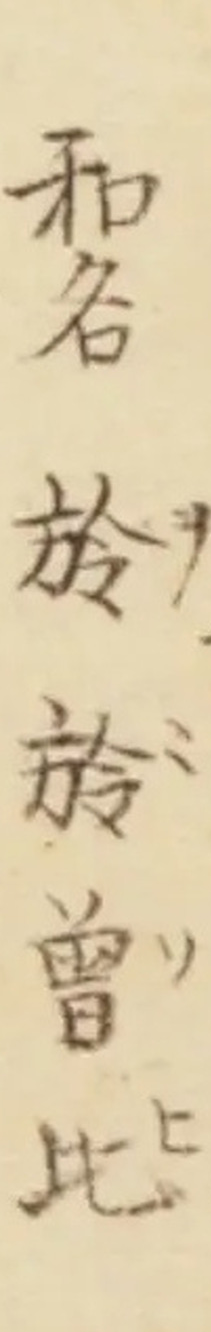和名於於曽比
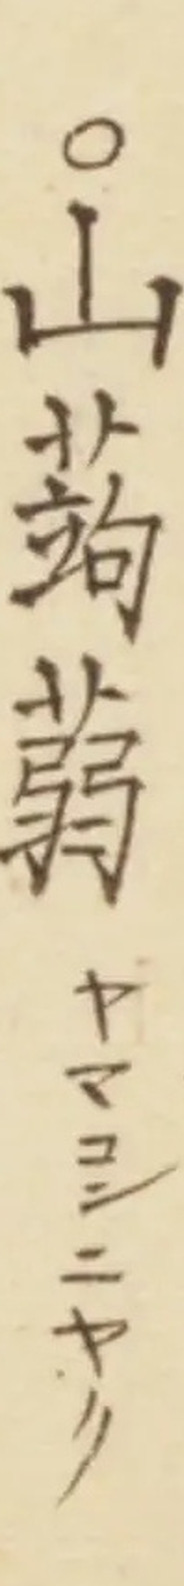◦山蒟蒻ヤマコンニヤク
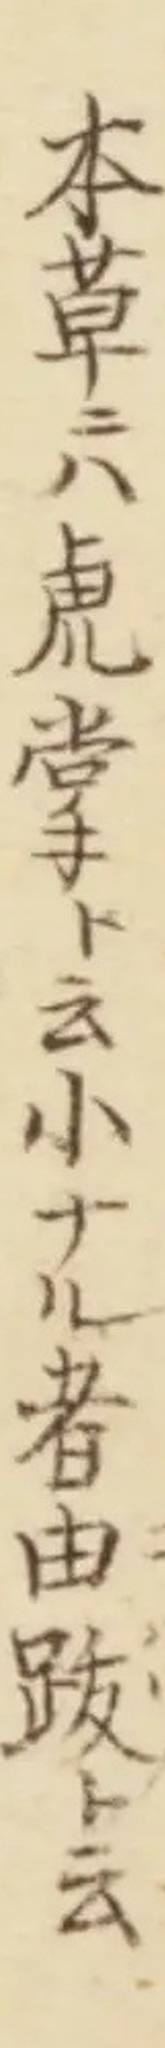本草ニハ虎掌ト云小ナル者ハ由跋ト云
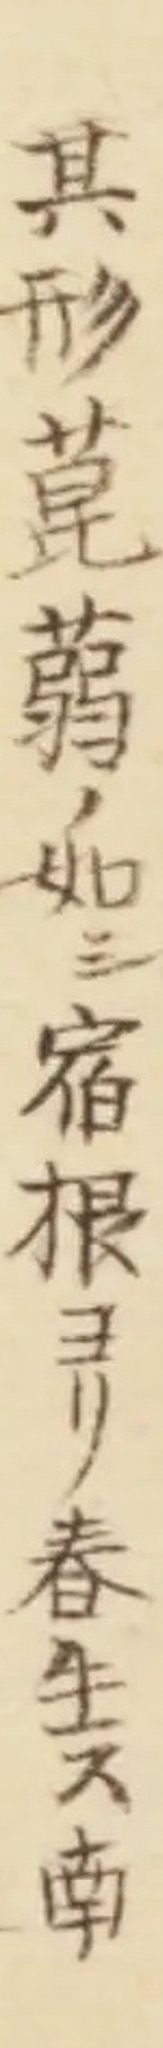其形菎蒻ノ如シ宿根ヨリ春生ス南
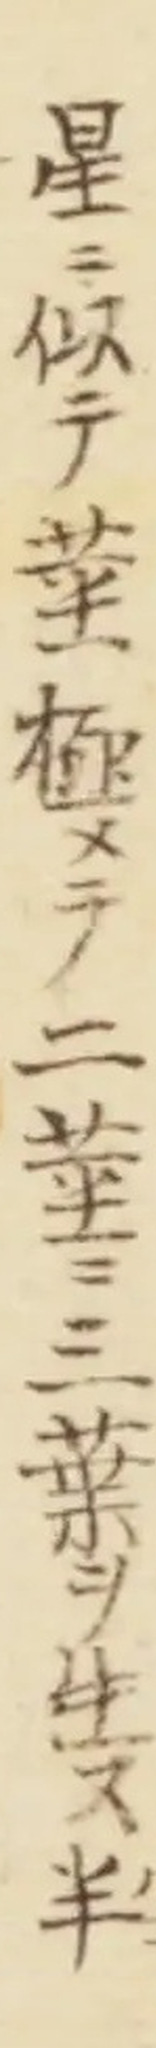星ニ似テ茎極メテ二茎三葉生ス半
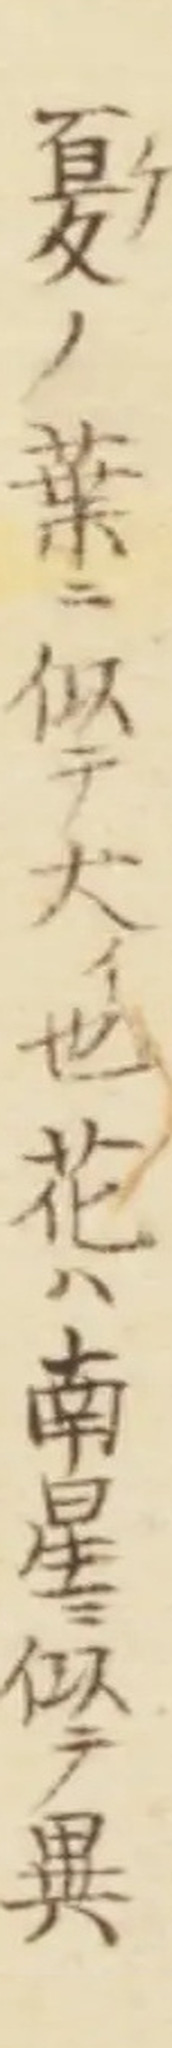夏ノ葉ニ似テ大イ也花ハ南星ニ似テ異
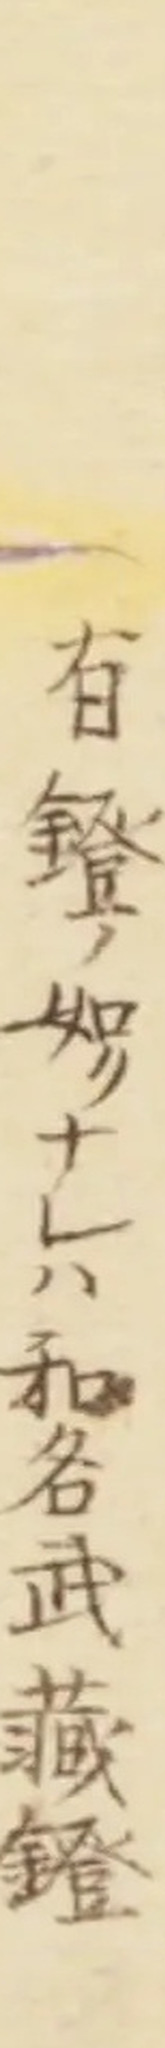有鐙ノ如クナレハ和名武蔵鐙
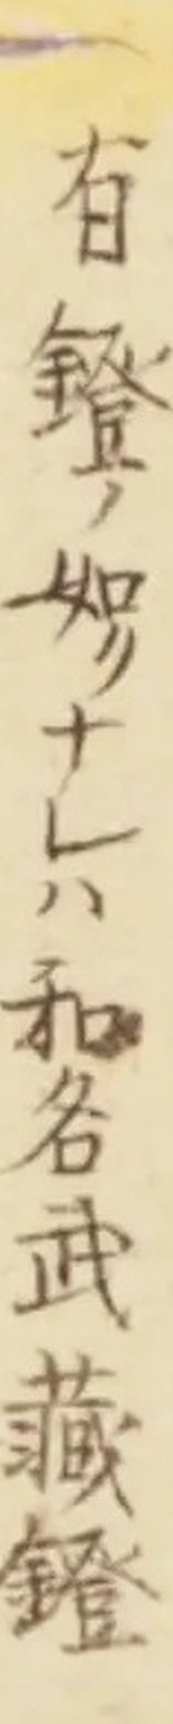有鐙ノ如クナレハ和名武蔵鐙
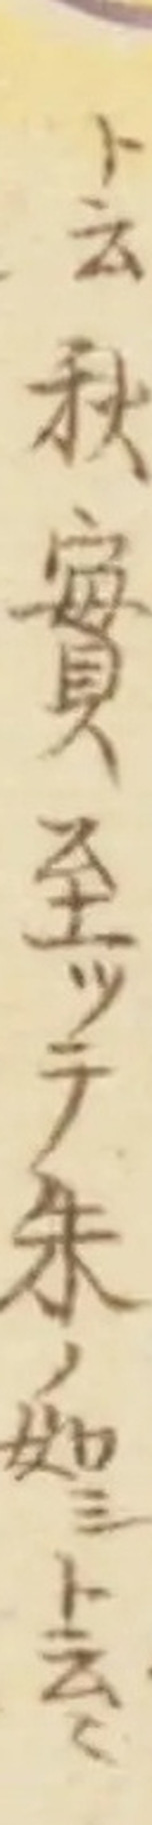ト云秋実至ツテ朱ノ如シト云々
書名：梅園草木花譜春之部. 1
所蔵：国立国会図書館 National Diet Library, JAPAN
